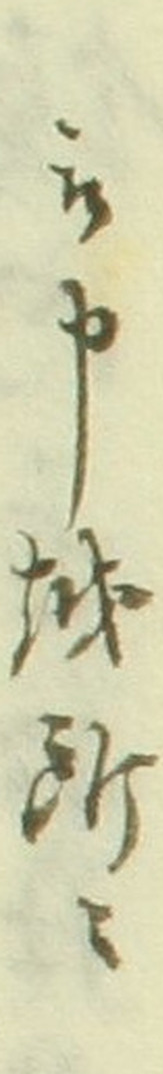被申越所に
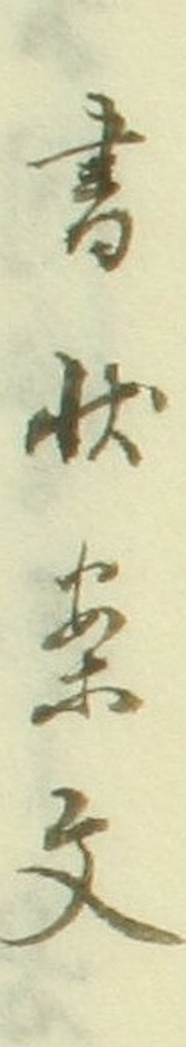書状案文
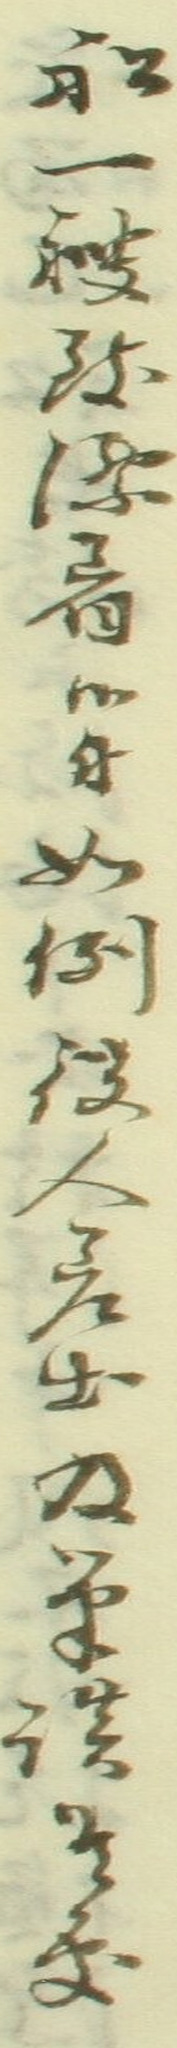船一艘致漂着候付如例役人差出及筆談候処

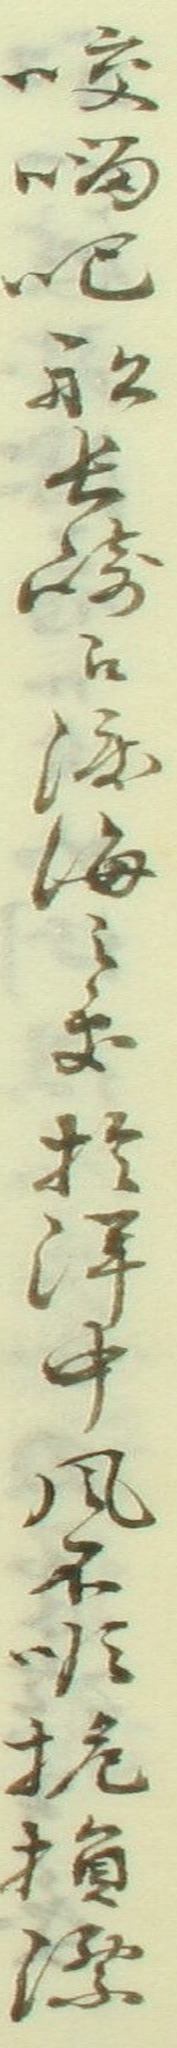咬𠺕吧船長崎え渡海之処於洋中風不順垝損漂
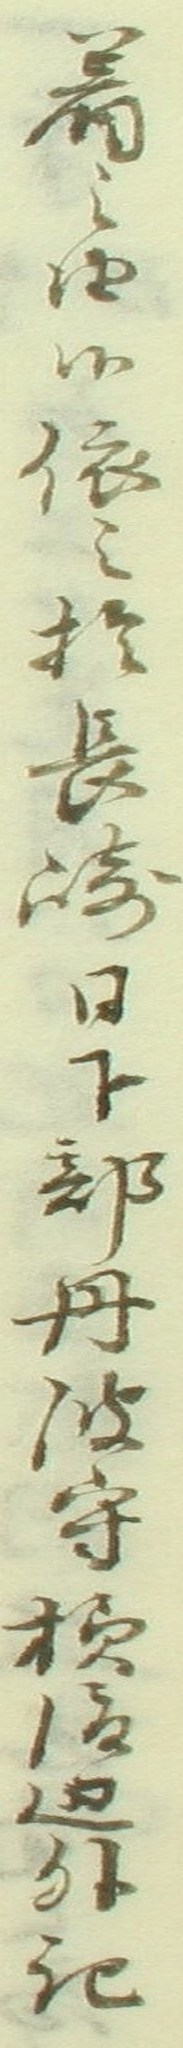着之由候依之於長崎日下部丹波守様渡辺外記
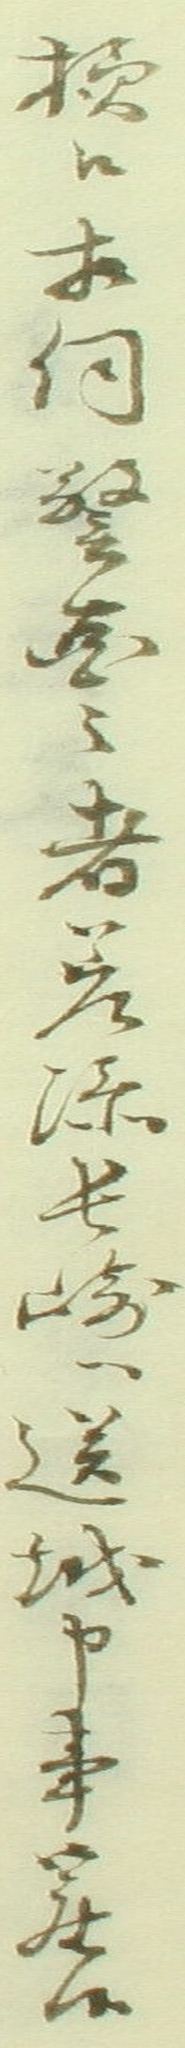様え相伺警固之者差添長崎へ送越申事御座候
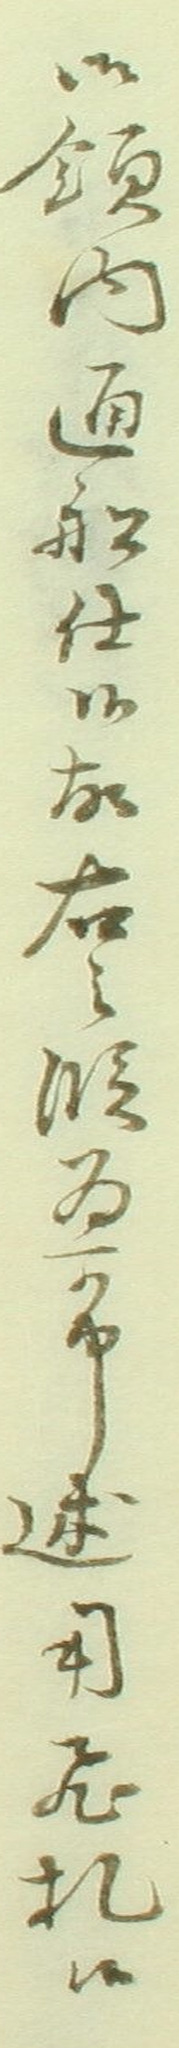御領内通線船仕候故右之段為可申述用飛札候
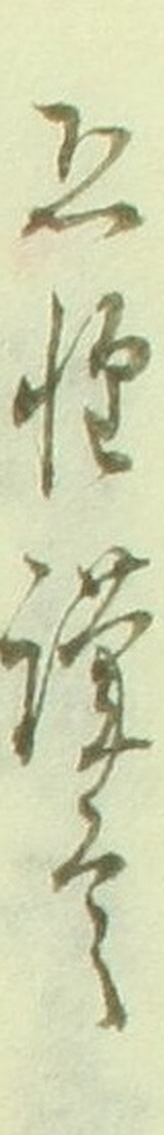恐々謹言
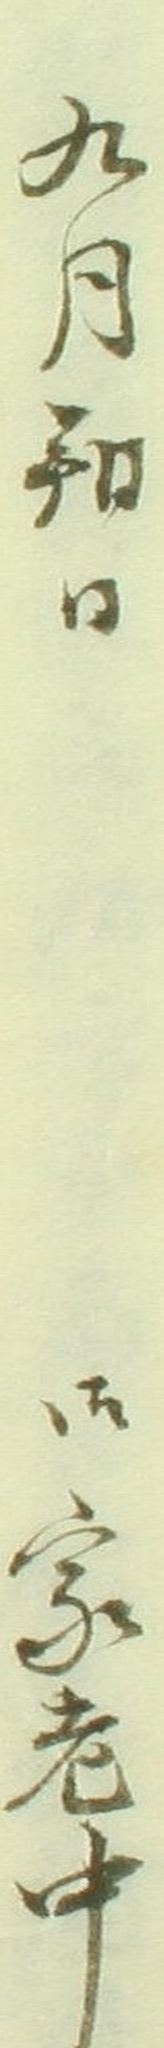九月朔日御家老中
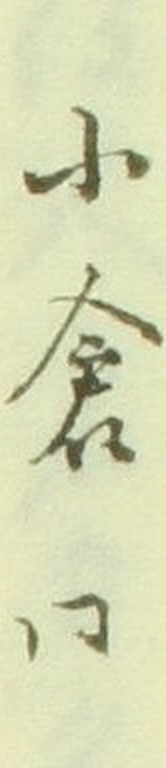小倉同
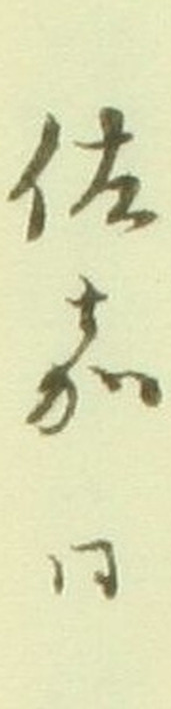佐嘉同
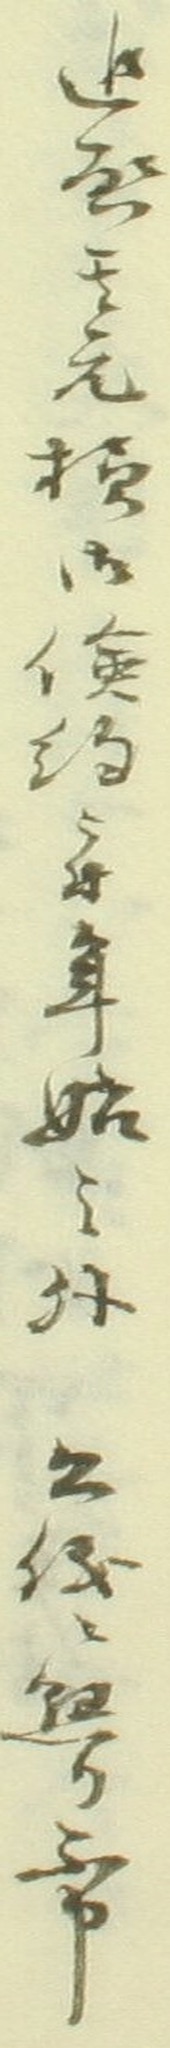追啓其元様御倹約に付年始之外公儀に懸り不申
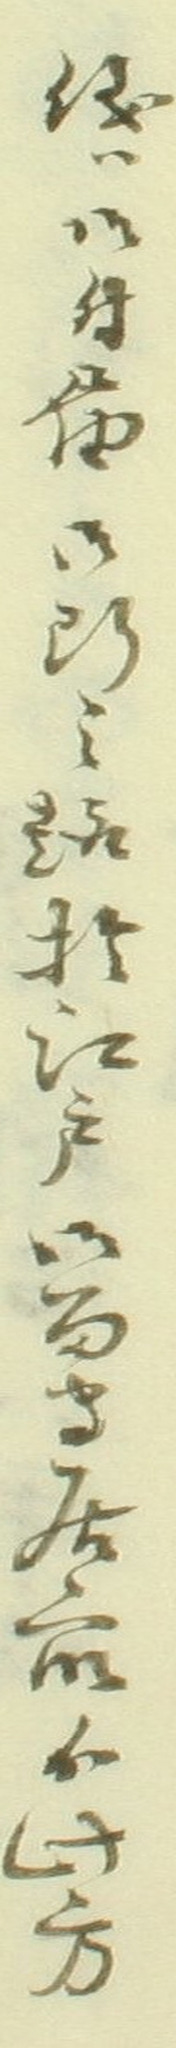儀は御付届御断之趣於江戸御留守居衆ゟ此方
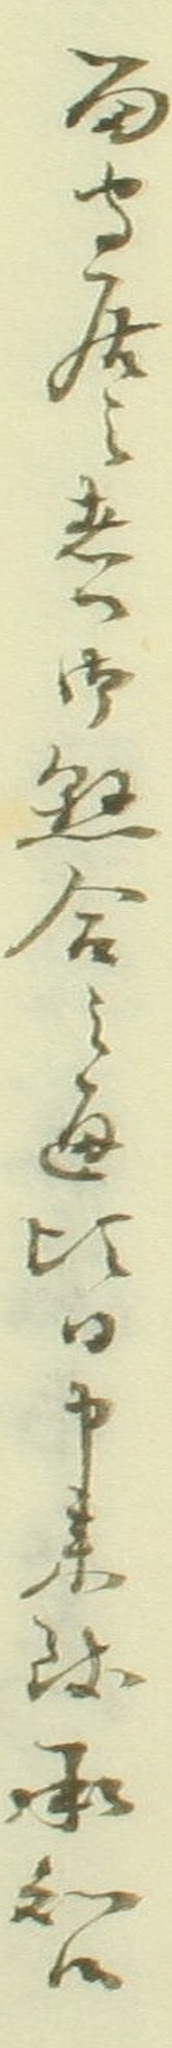留守居之者へ御懸合之通頃日申来致承知候
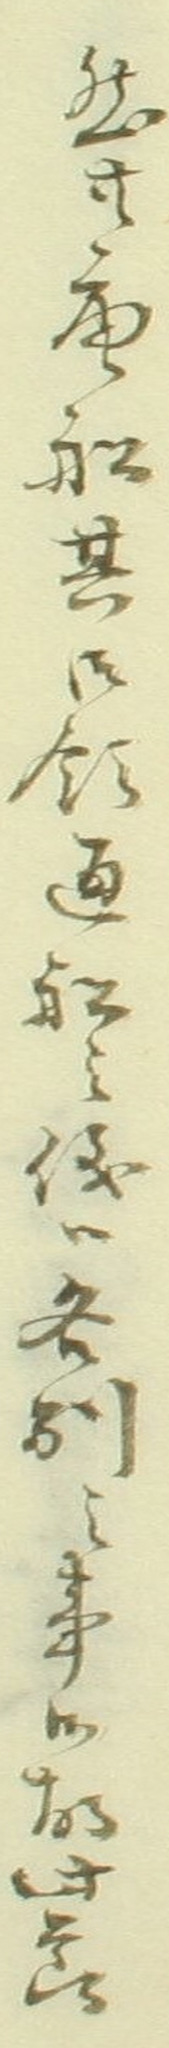然共唐船其御領通船之儀は各別之事候故此節
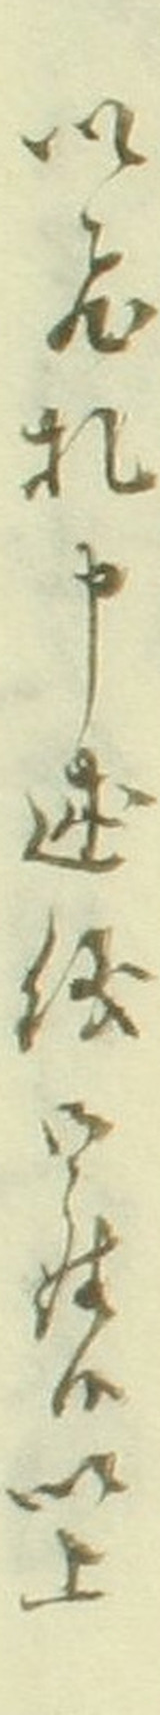以飛札申述儀御座候以上
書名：異国船漂着記
